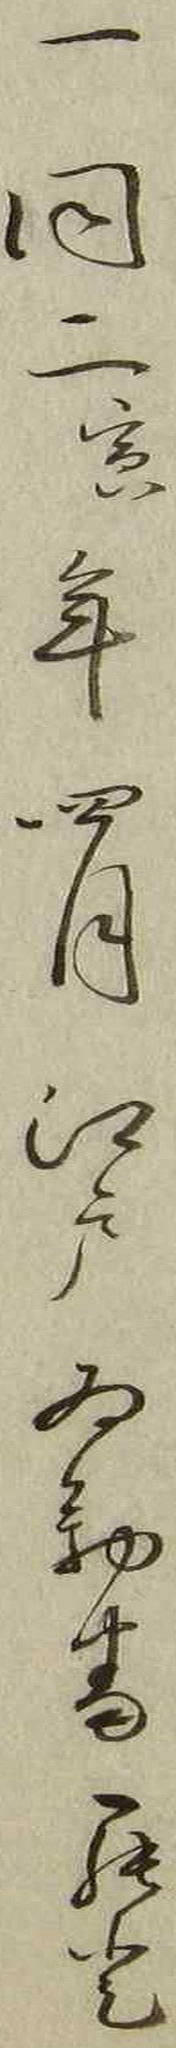一同二寅年四月江戸為勤番罷登
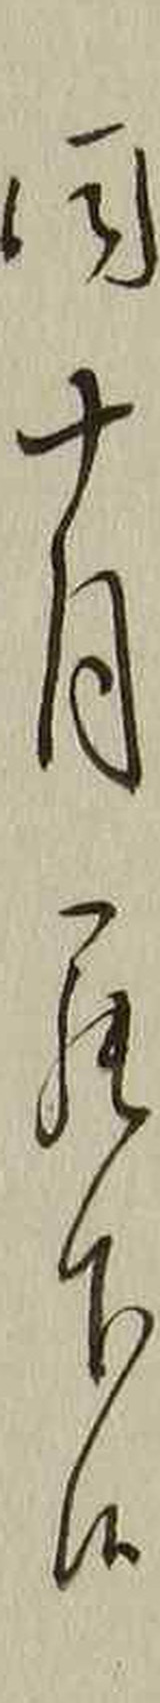同十月罷下候
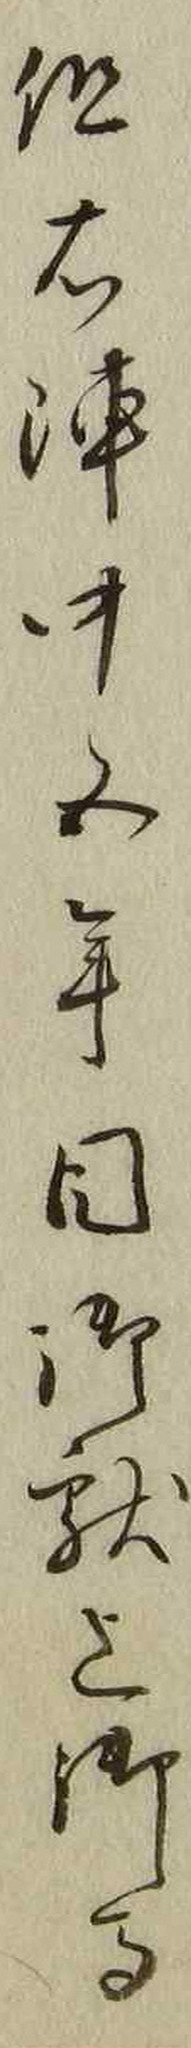但右陣中五年目御献上御馬
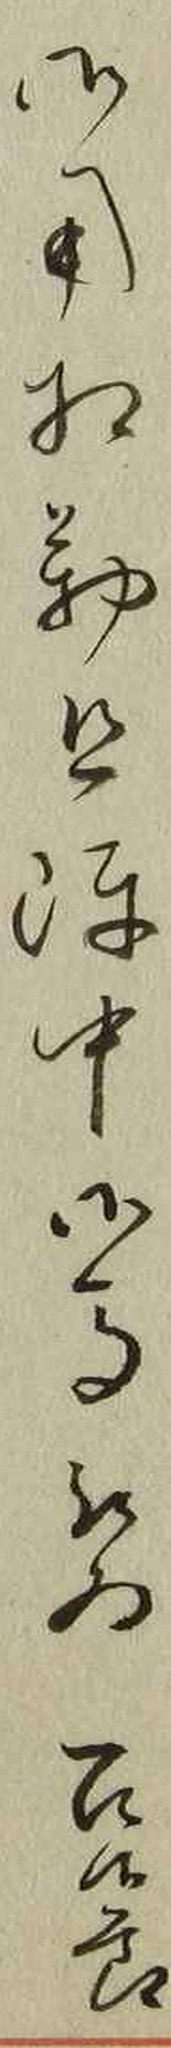御用相勤且陣中御馬被為召候節
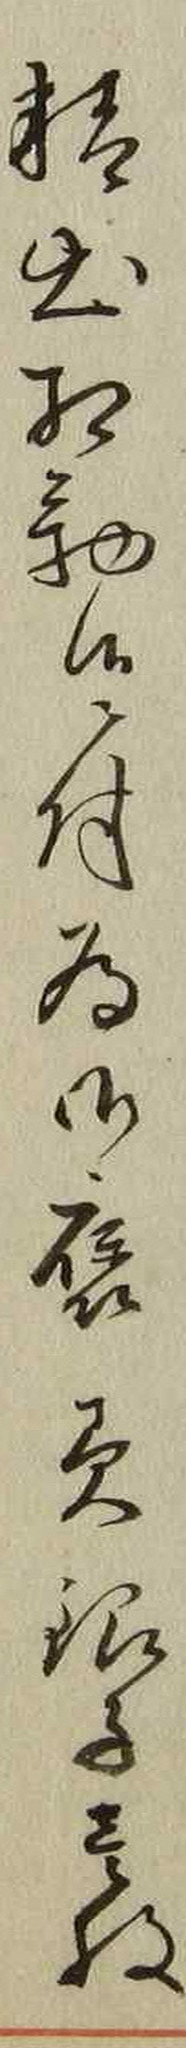精出相勤候ニ付為御褒美銀子壱枚
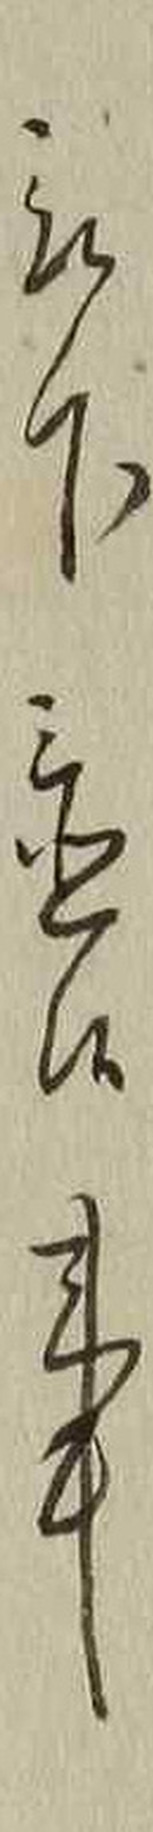被下置候事
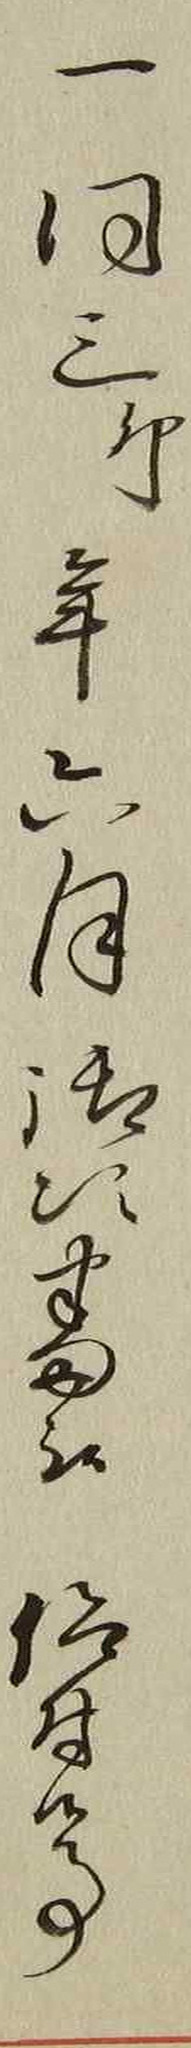一同三卯年六月御次番被仰付候事
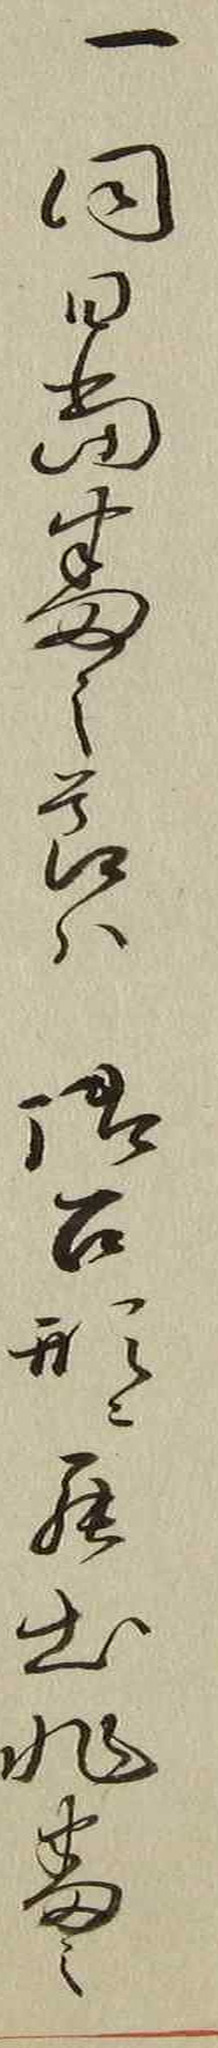一同日当番之節ハ御召形ニ罷出非番之
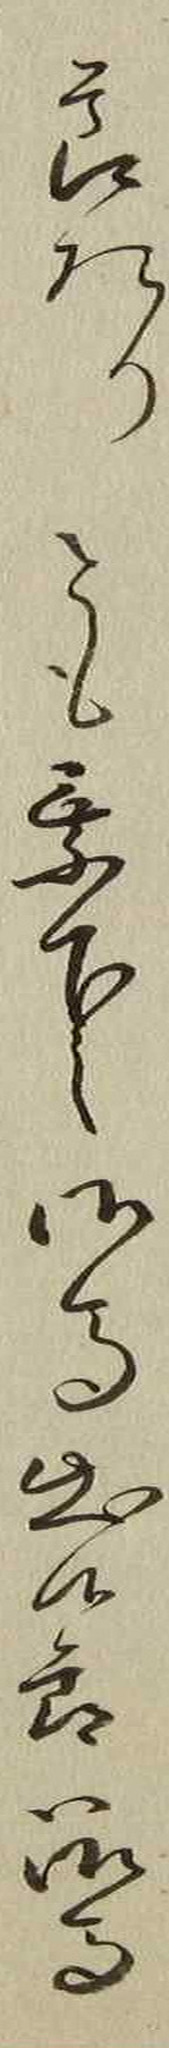節たりとも乗下之御馬出候節ハ御馬
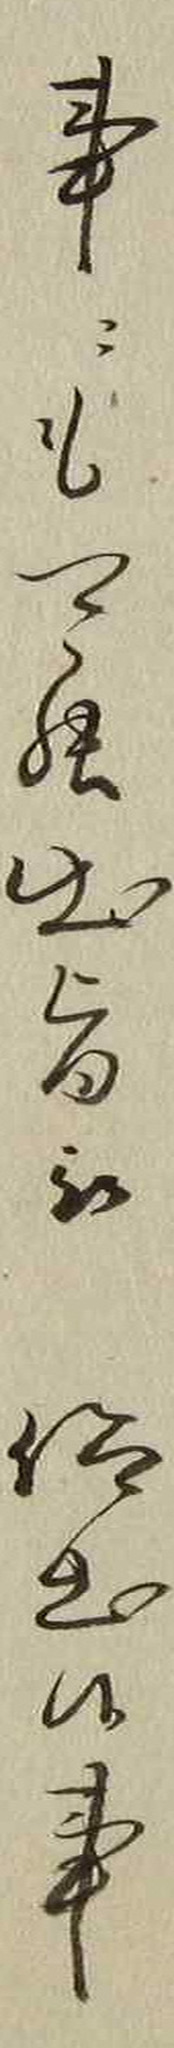事ニも可罷出旨被仰出候事
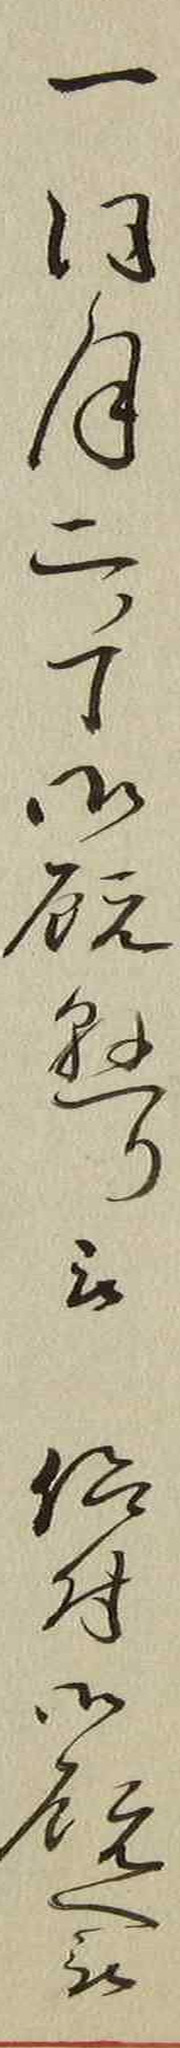一同月二ノ丁御厩懸り被仰付御厩へ被
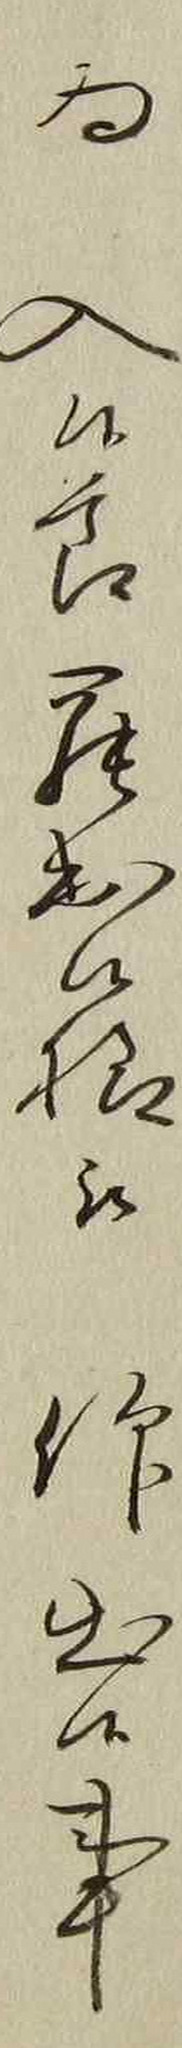為入候節罷出候様被仰出候事
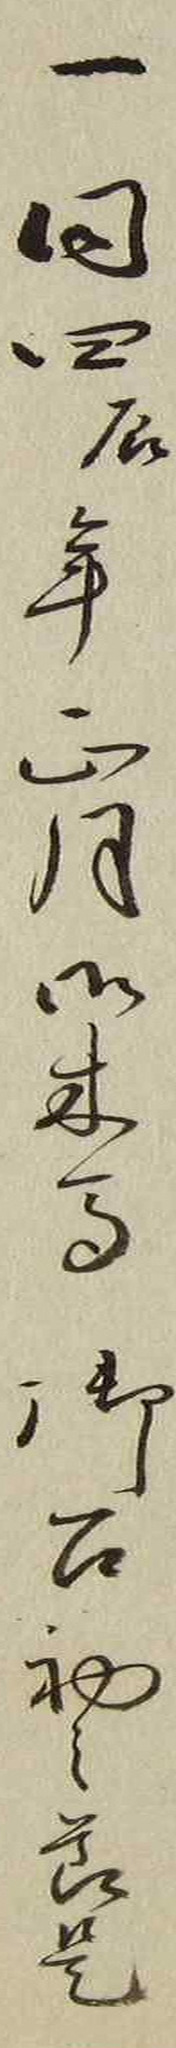一同四辰年正月御木馬御召初之節是
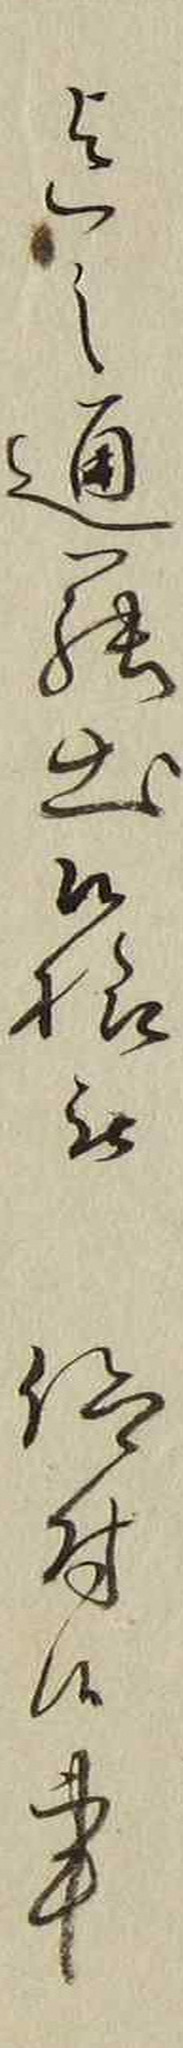迄之通罷出候様被仰付候事
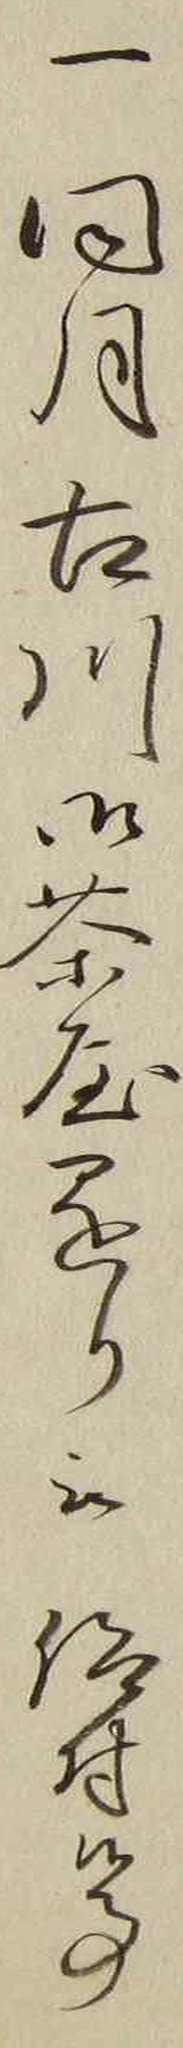一同月古川御茶屋懸り被仰付候事

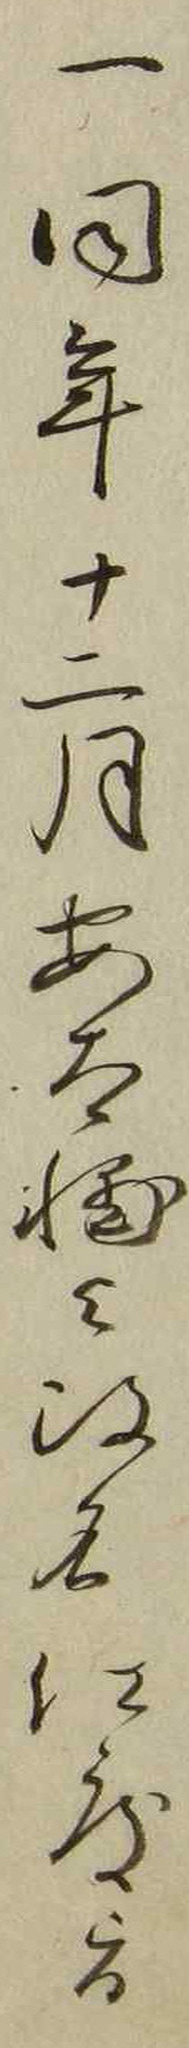一同年十二月安太輔与改名仕度旨
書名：諸士系譜　巻之3　い之部3
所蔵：会津若松市立会津図書館
